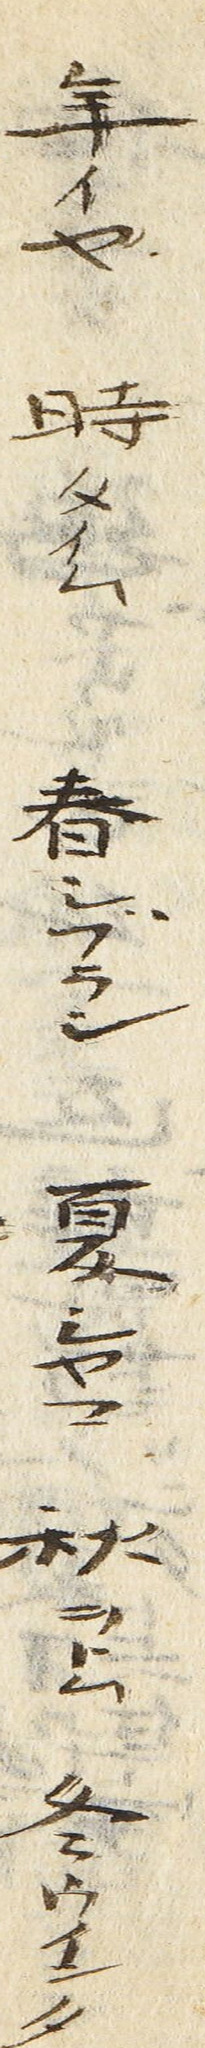年イヤ時タイム春シフラン夏シヤマ秋ヲタム冬ウインタ
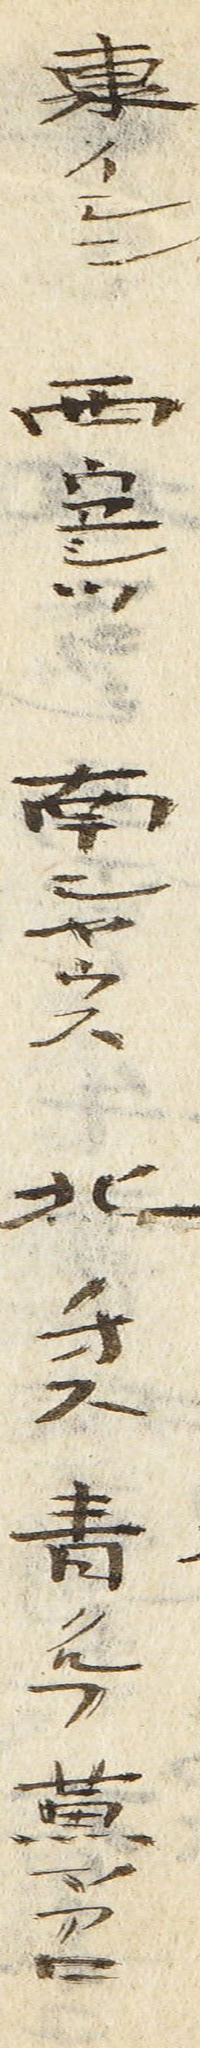東イシン西ウエシツ南シヤウス北ノオス青クルフ黄ヤアロ
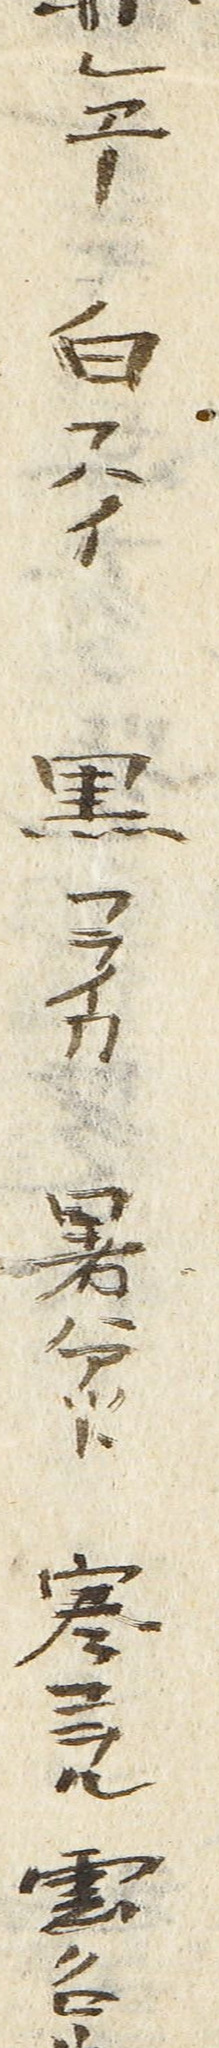赤レエ－白フハイ黒フライカ暑ハアツト寒コラル雲クロウ
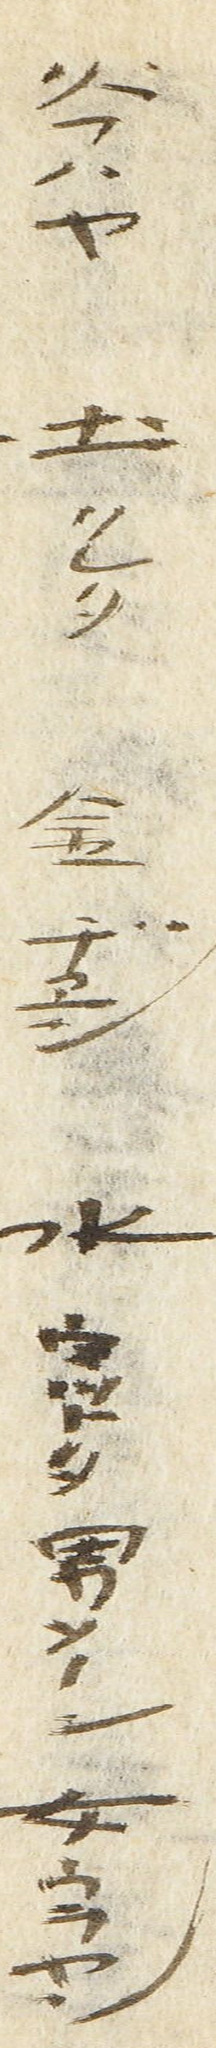火フハヤ土クレタ金チエン水ウツトタ男メ－ン女ウラヤン
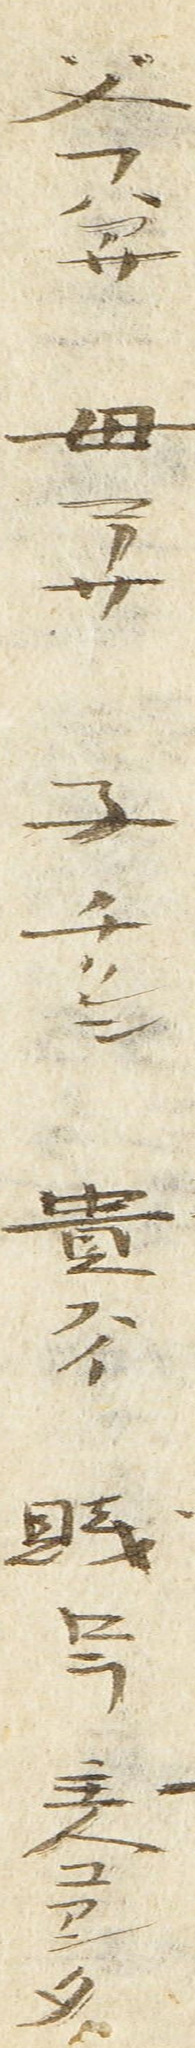父フハアサ母マ－サ子チリレン貴スイ財ロラ主人ユアンタ

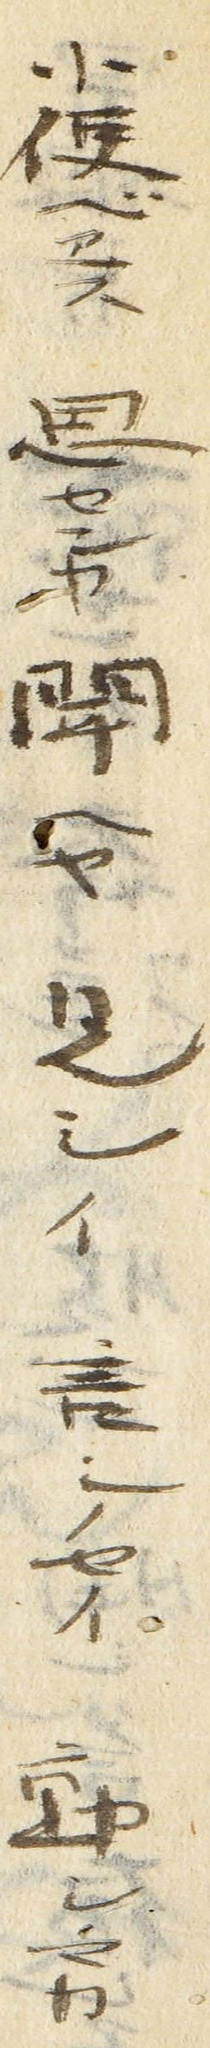小便ベエス思センカ開ハヤ見シイ言うシノセイ動シ－マカ
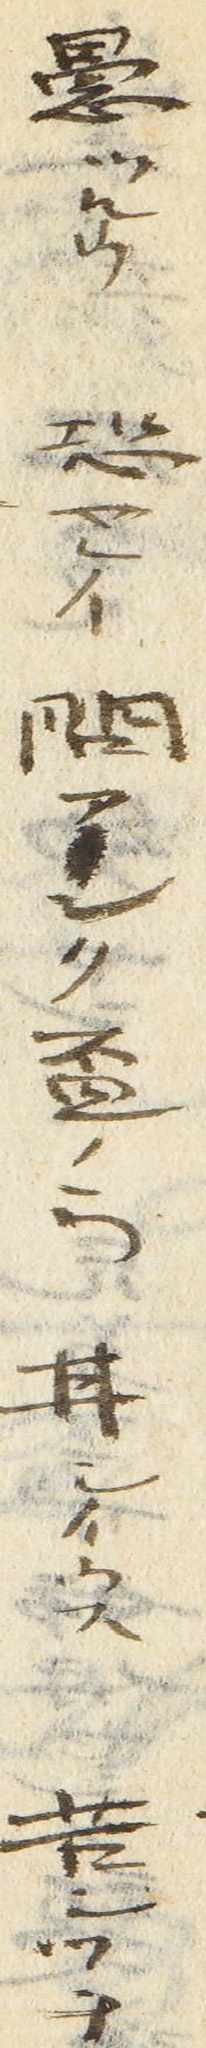愚ツルウ恐ヤレイ問ア－ンタ盃ノ井シイウス昔シツチ
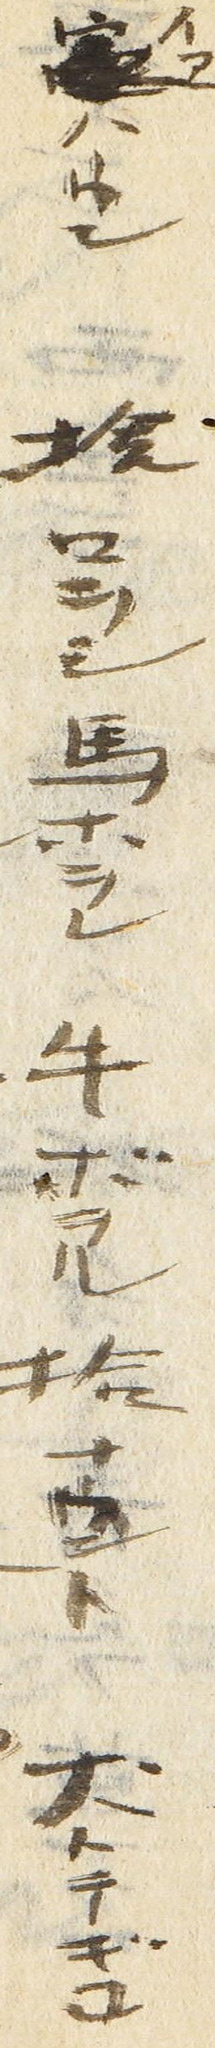ハウンロラシ馬ホラレ牛ボラル捨ナウううト犬トテギロ
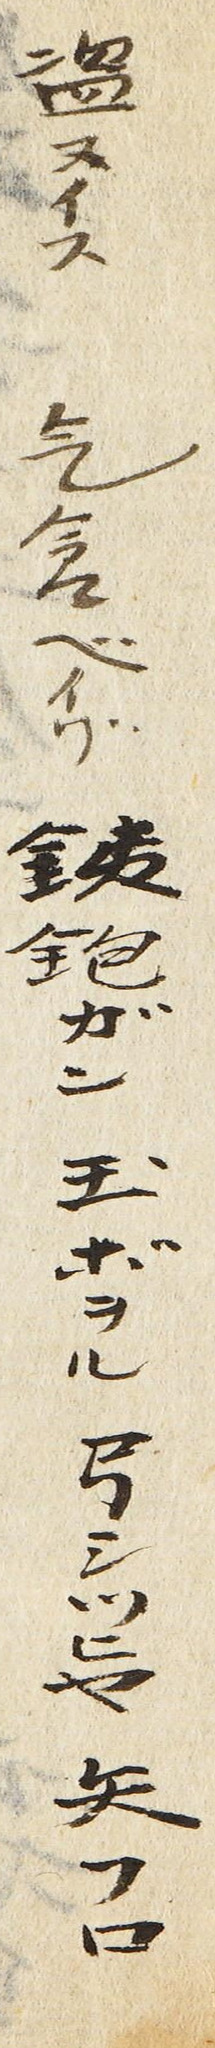盗ヌイス乞食ベイブ鉄鉋ガン玉ボヲル弓シツヒヤ矢フロ
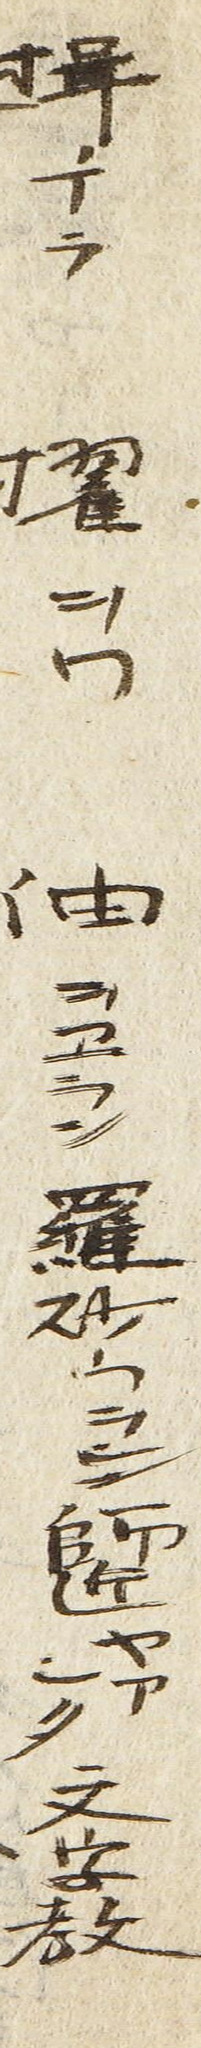楫チラ櫂ヲワ油ヲエラン羅紗ウラニン師匠ヤアシタ文字教
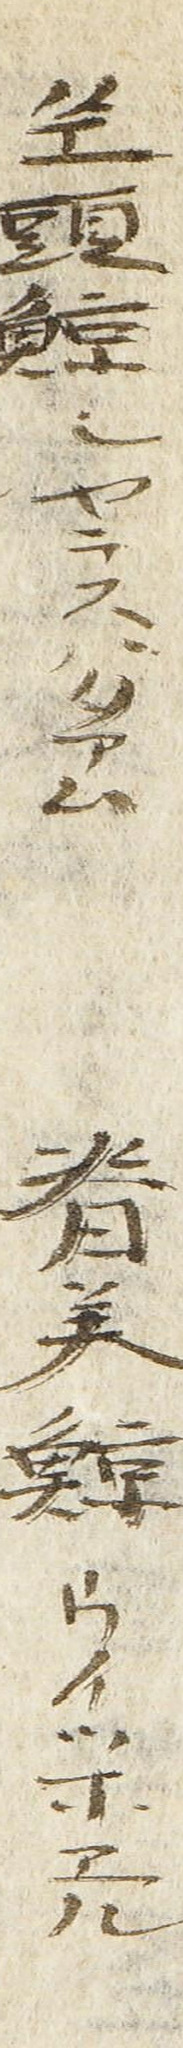座頭鯨シヤラスハタアム背美鯨ウイツホエル
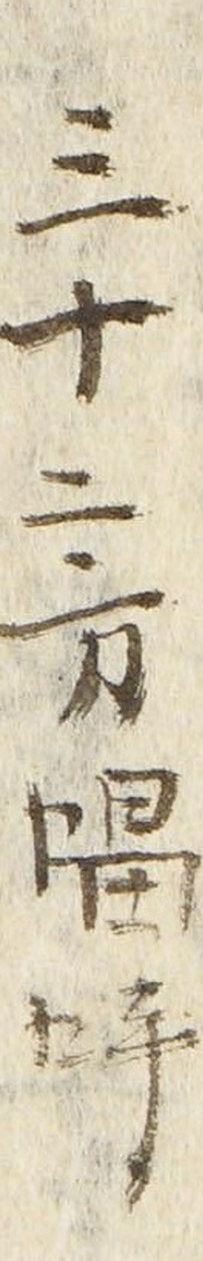三十二方唱呼

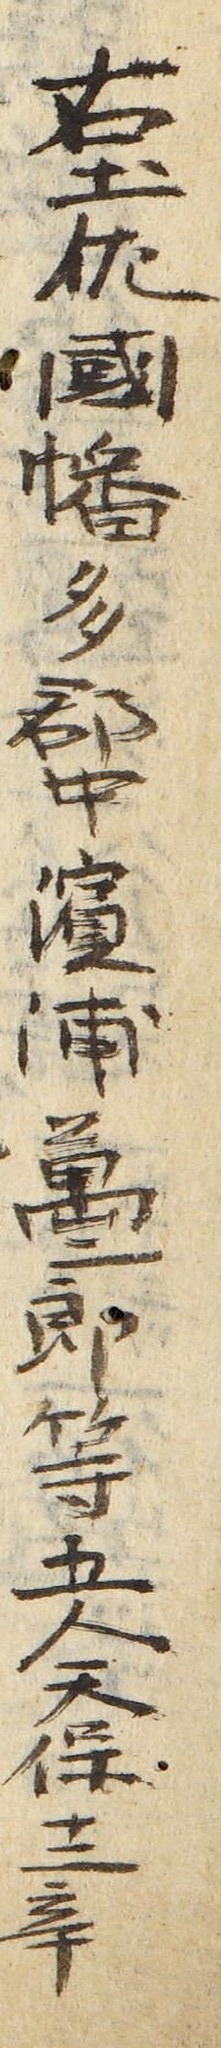右土佐国博多郡中濱浦萬二郎等五人天保十二辛
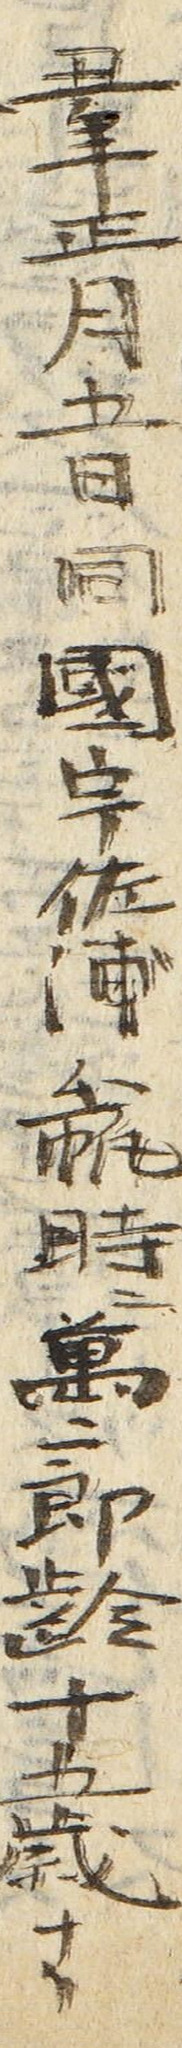丑年正月五日同国宇佐浦出帆時ニ萬二郎齢十五歳
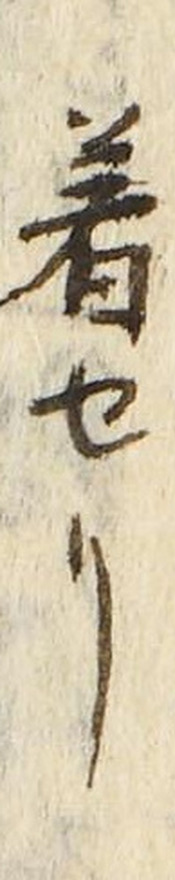着セリ
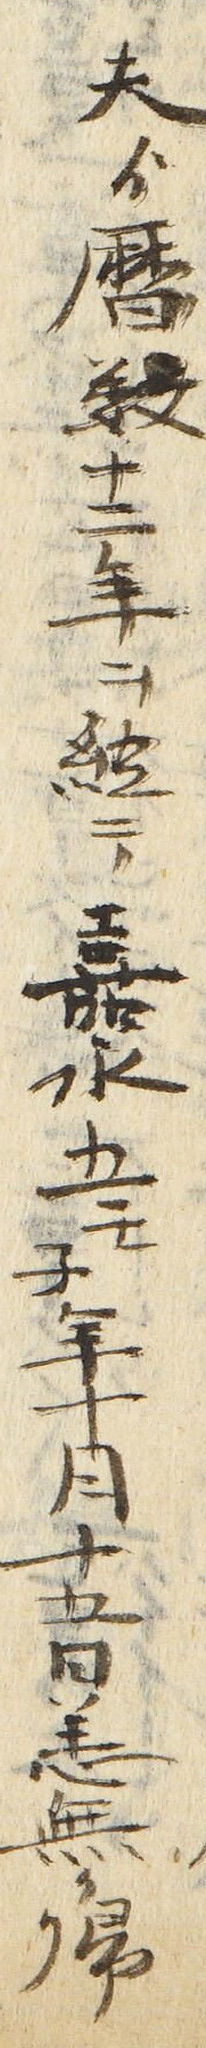夫ゟ暦数十二年ヲ経テ嘉永五壬子年十月十五日恙無ク帰
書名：漂流記聞
